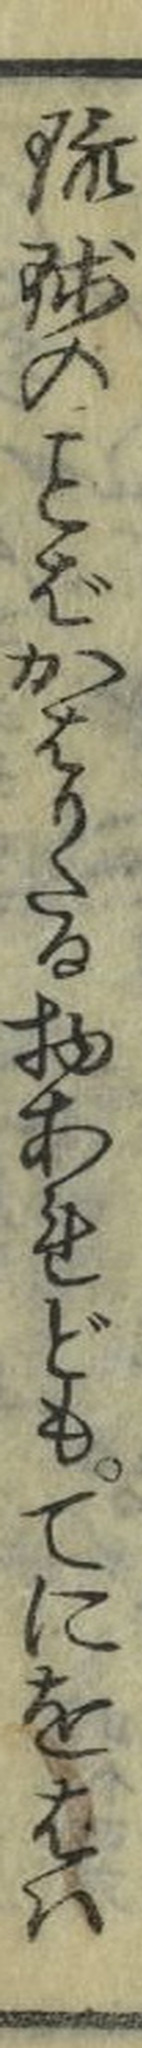琉球のことばかはりたる物あれども。てにをはハ
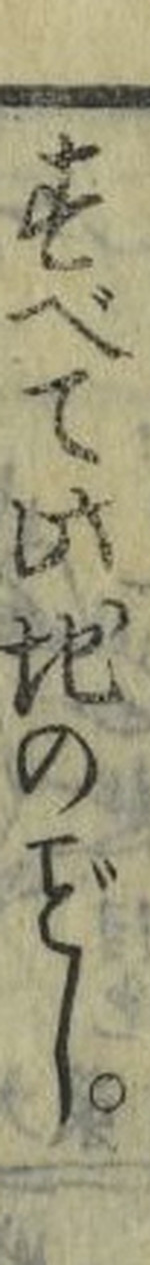すべて此地のごとし。

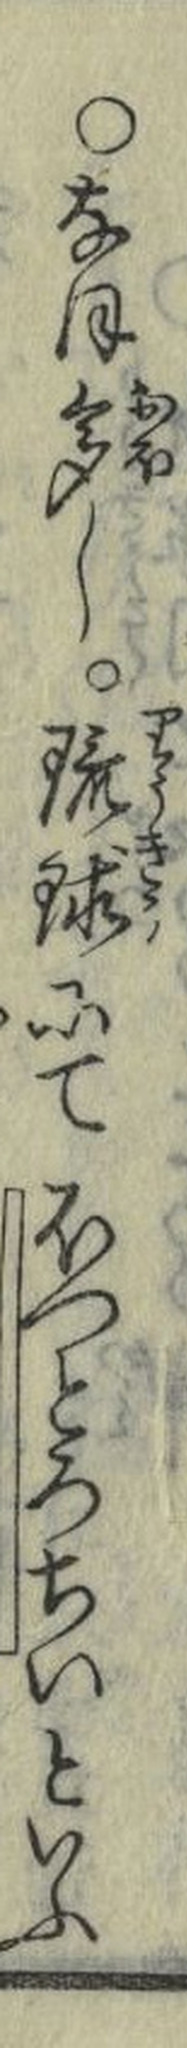〇なほ多く。琉球にて[ほつとろちい]といふ
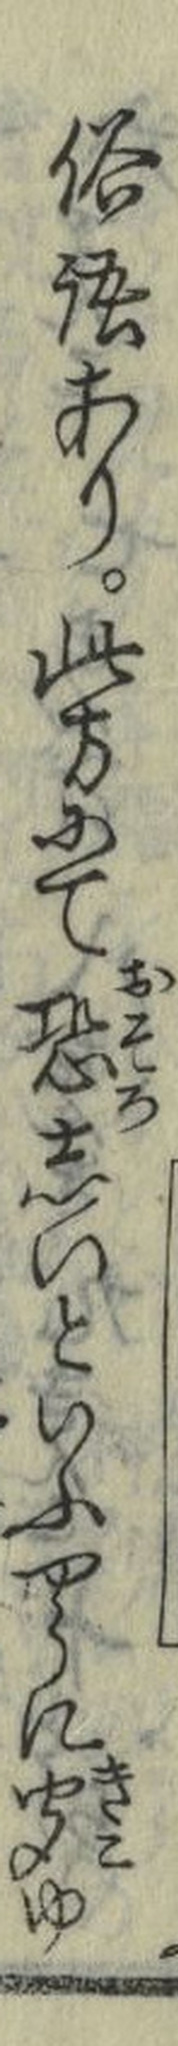俗語あり。此方にて恐しいといふやうに聞ゆ
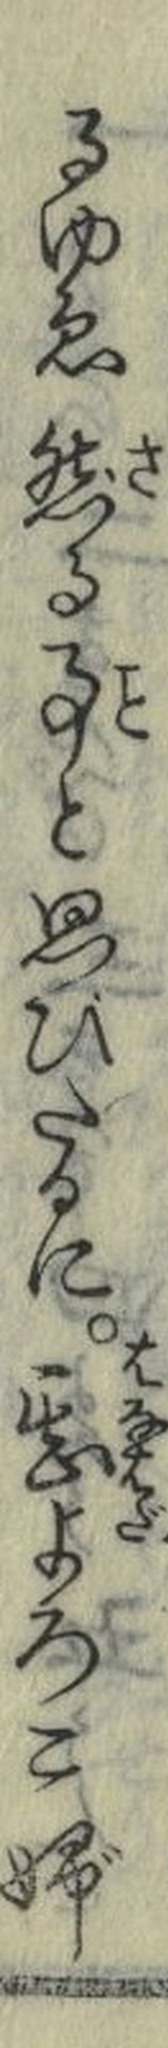るゆゑ然る事と思ひたるに。甚よろこぶ
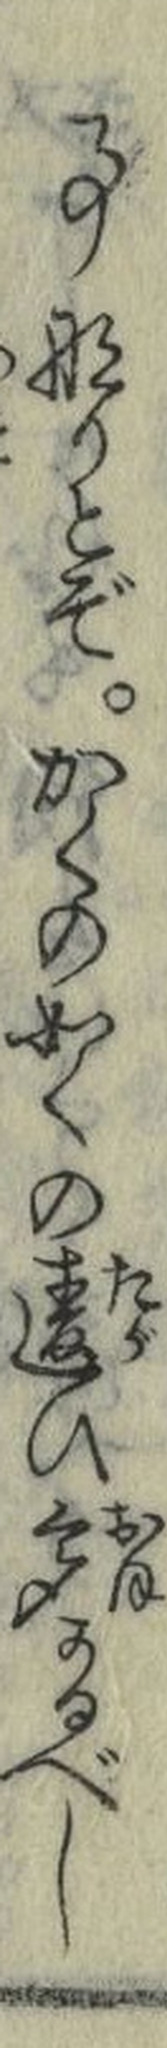事なりとぞ。かくの如くの違ひ多かるべし
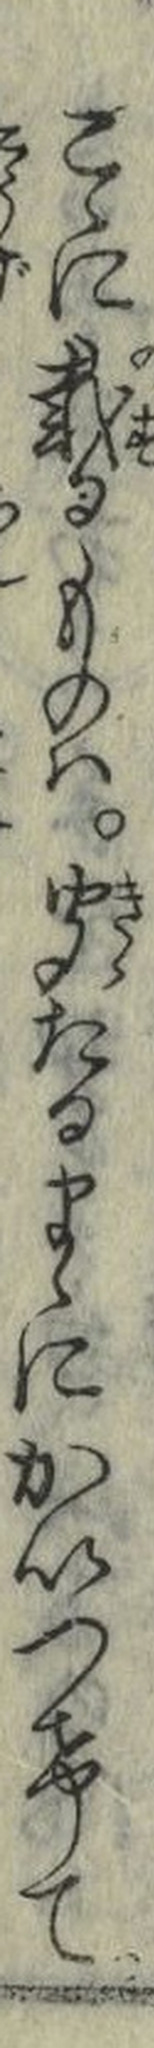こゝに載るものハ。聞たるまゝにかいつけて
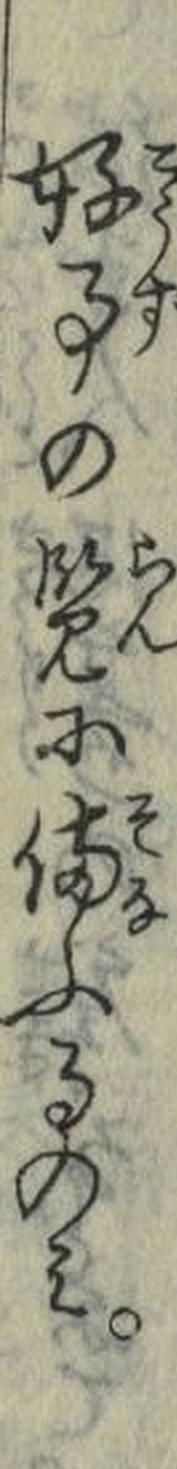好事の覧に備ふるのミ。

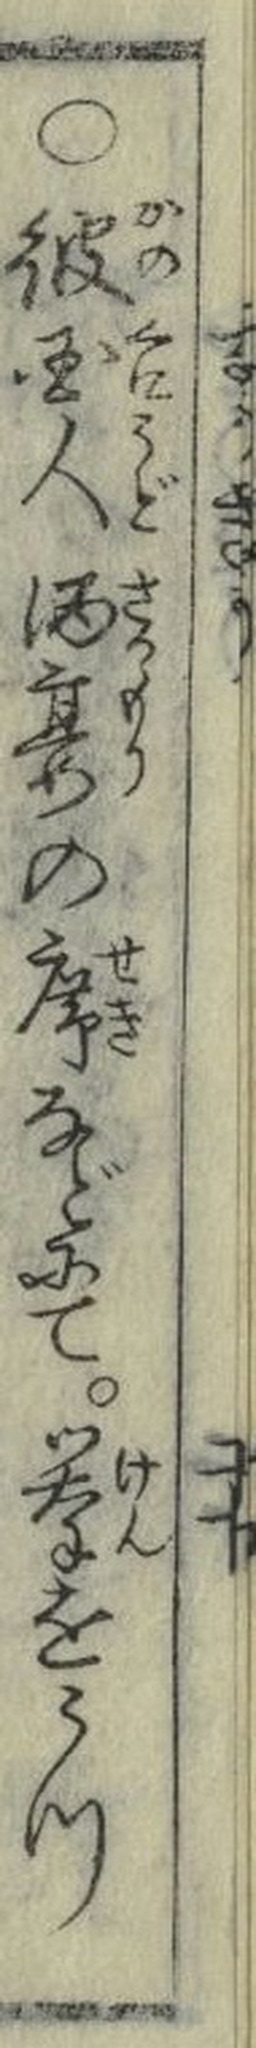〇彼国人酒宴の席などにて。拳をうつ
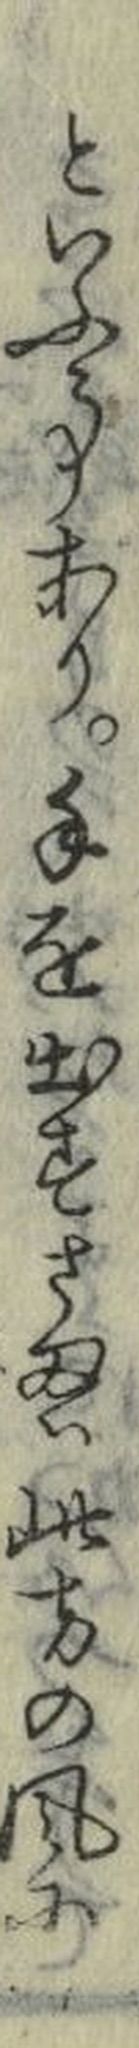といふ事あり。手を出すさまハ此方の風に
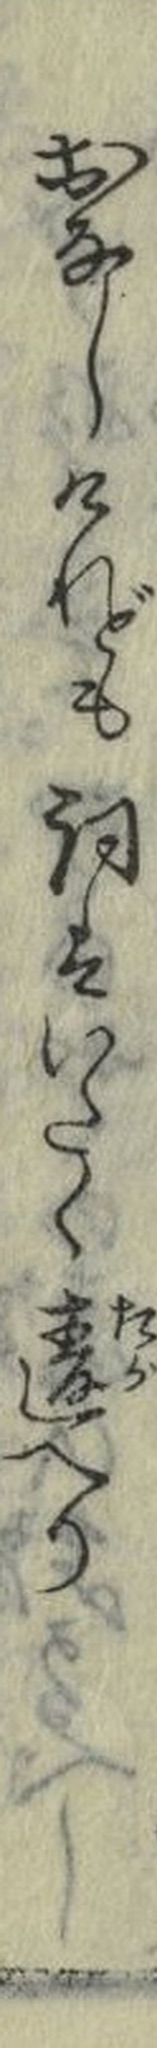おなしけれども詞はいたく違へり
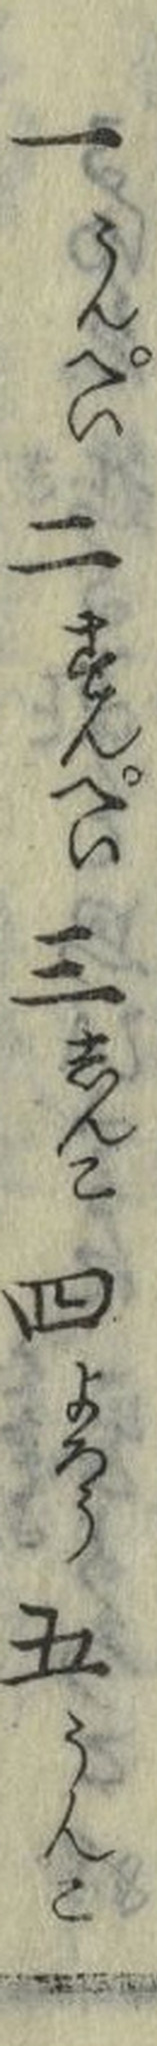一うんぺい二すんぺい三しんこ四よろう五うんこ
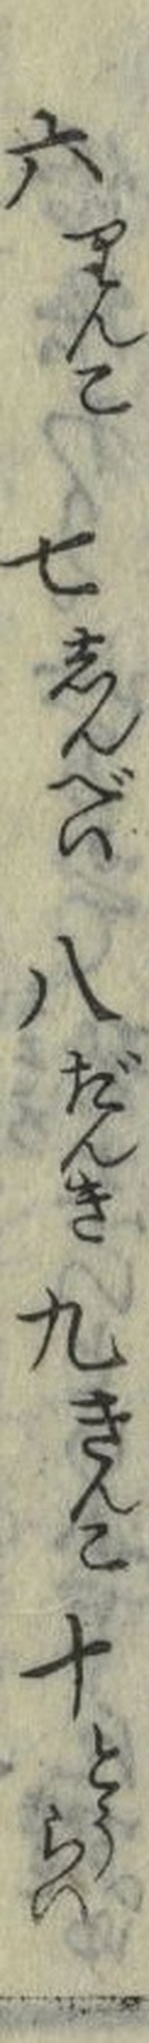六りんこ七しんべい八だんき九きんこ十とうらい
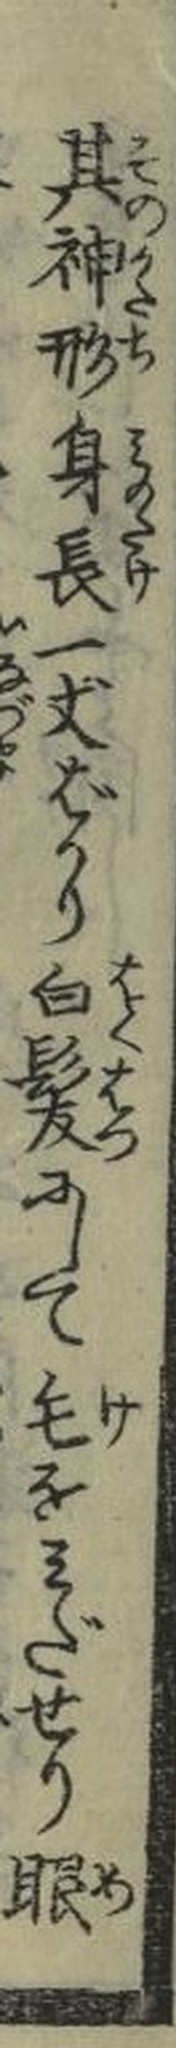其神形身長一丈ばかり白髪にして毛をミだせり眼
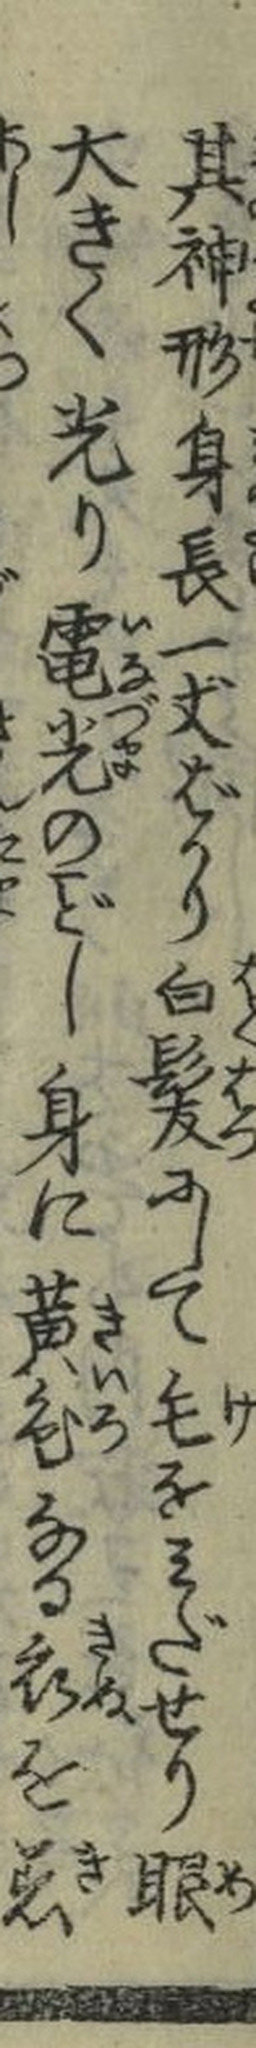大きく光り電光のごとし身に黄色なる衣を着
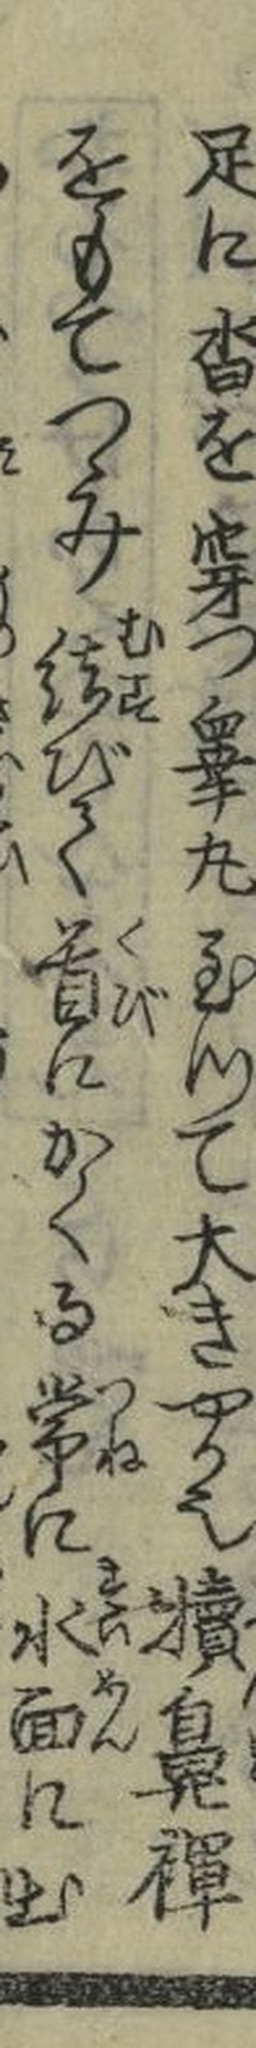をもてつゝみ結びて首にかくる常に水面に出
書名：琉球奇譚
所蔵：University of the Ryukyus Library
